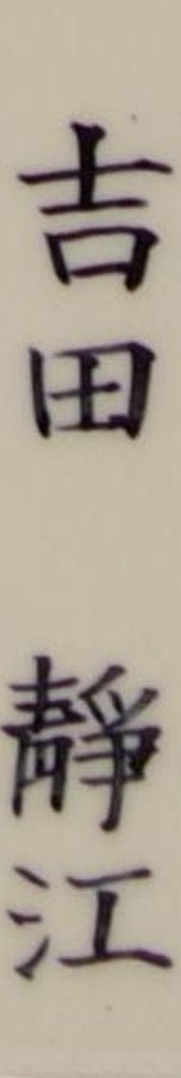吉田静江
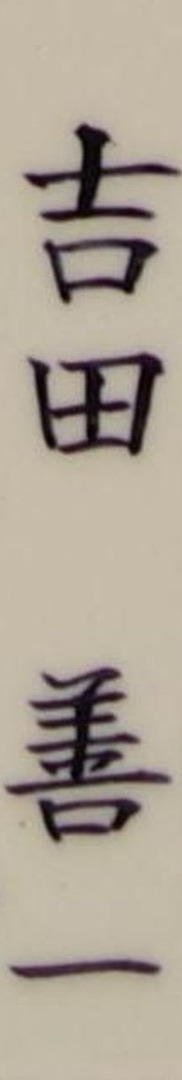吉田善一
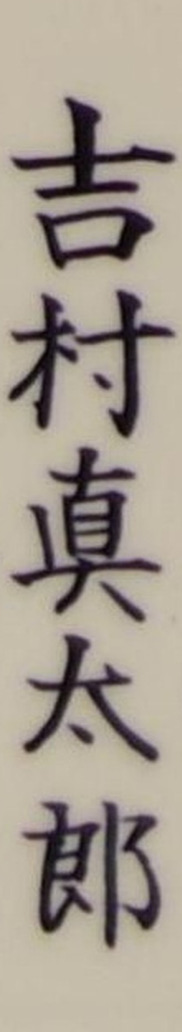吉村真太郎
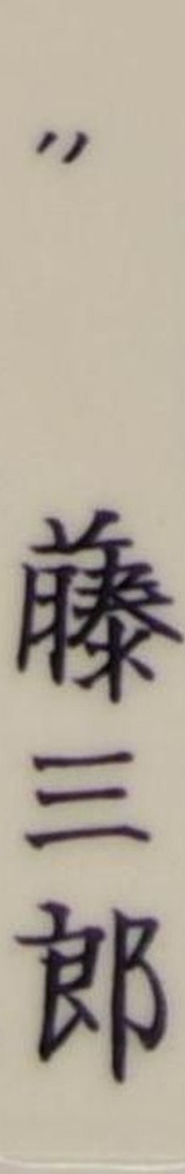藤三郎
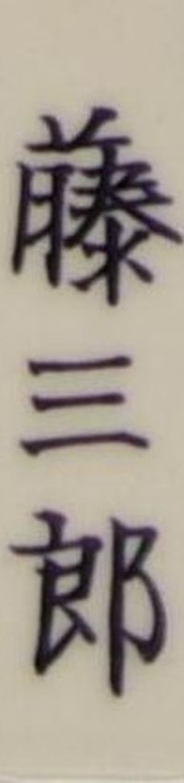藤三郎
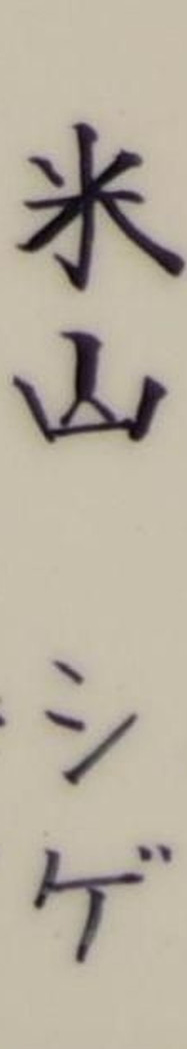米山シゲ
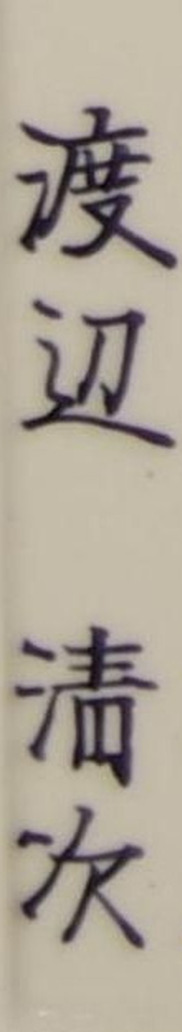渡辺清次

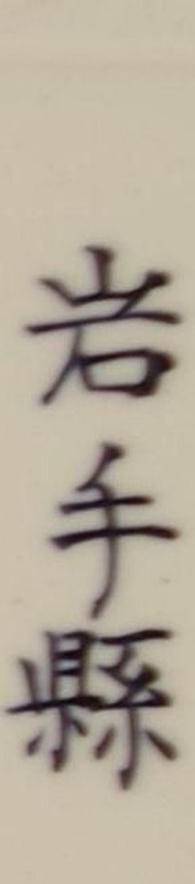＠岩手県
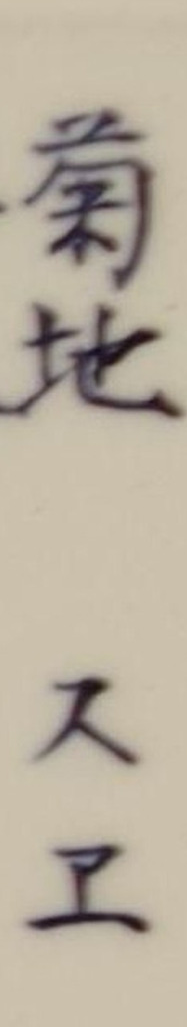菊池スヱ
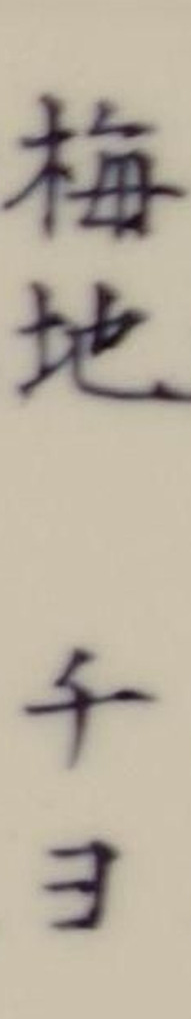梅地チヨ
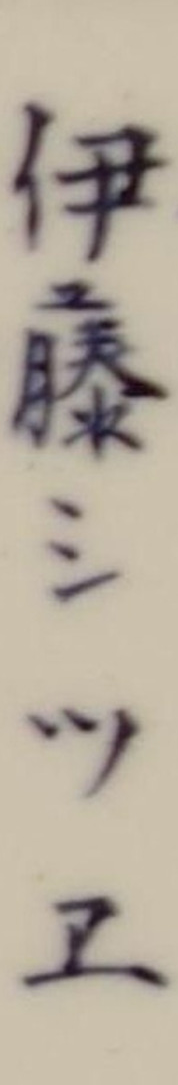伊藤シツヱ
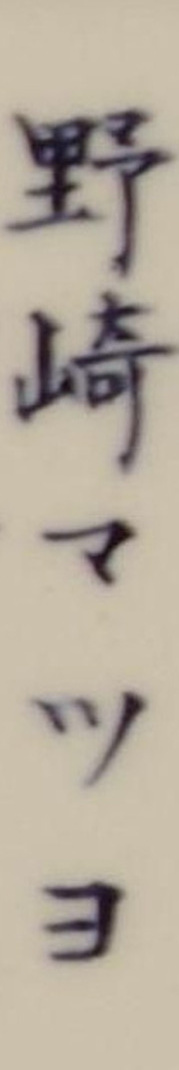野崎マツヨ
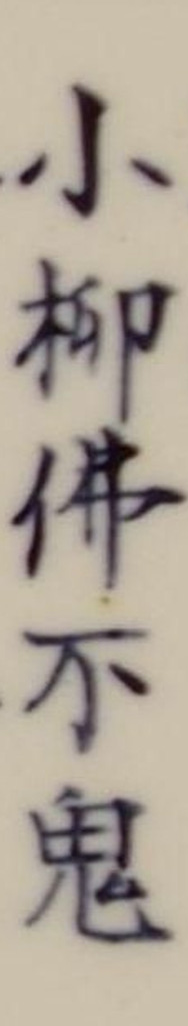小柳仏不鬼
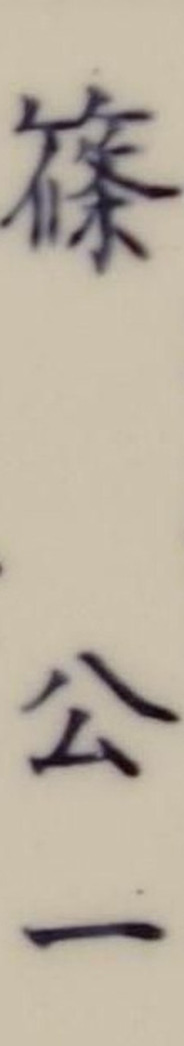篠公一
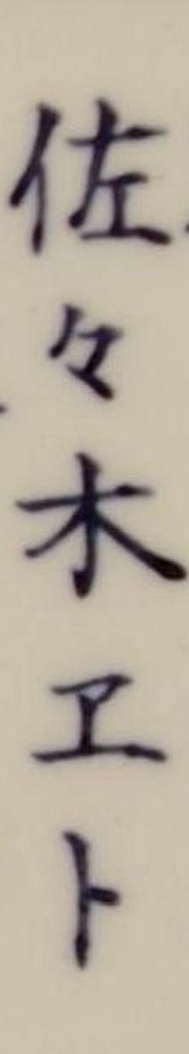佐々木ヱト
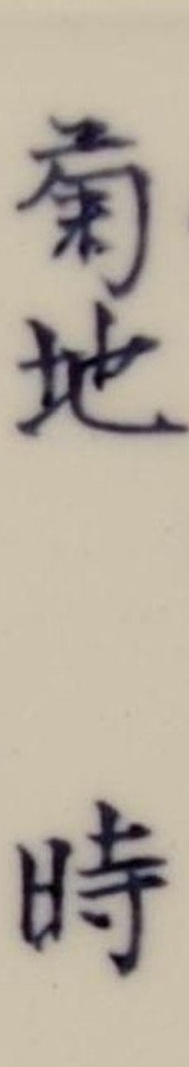菊地時
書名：E~L
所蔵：高野山金剛峯寺
